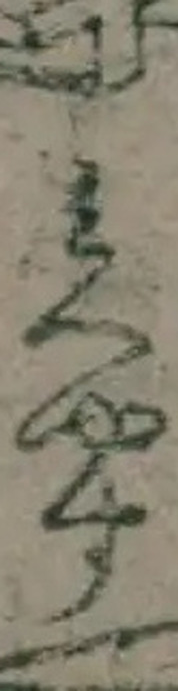みへやす

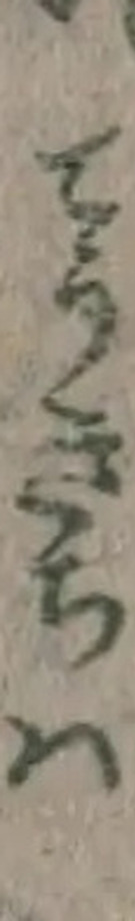てうきちは
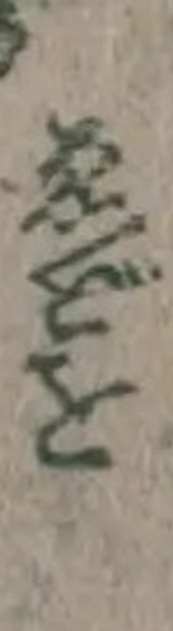ゑどを
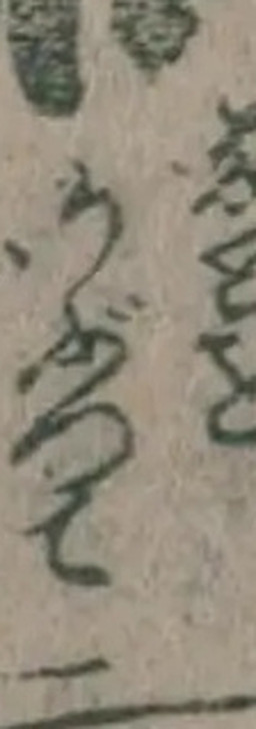かぶつて
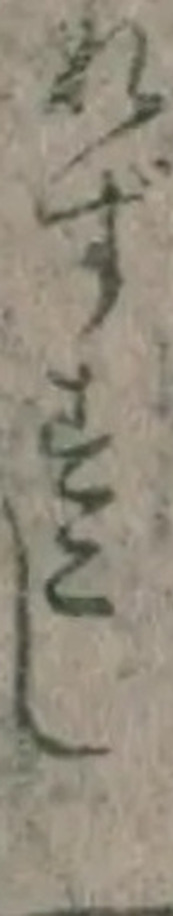れずすこし
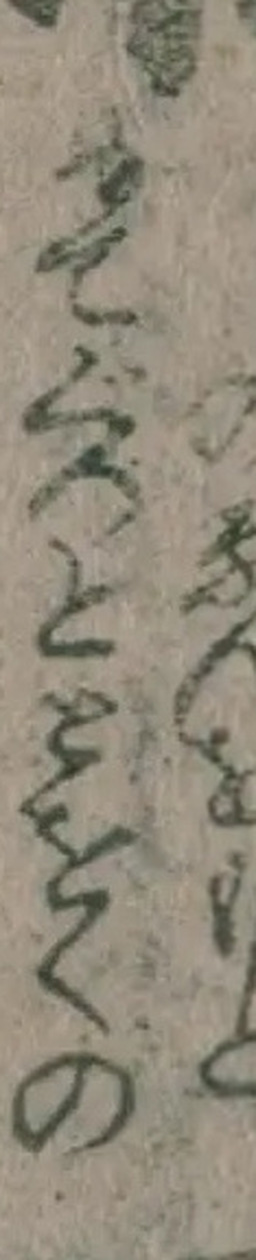めてぐつととをくの
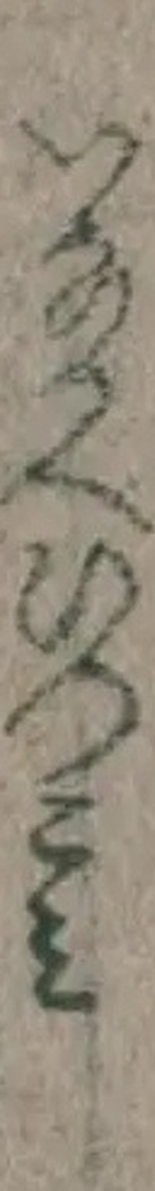いなかへひつこみ
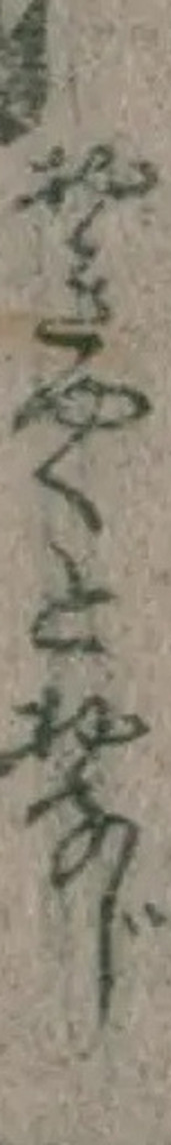おきやくとおなじ
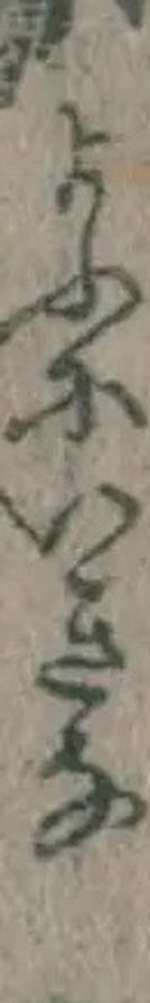よふにいきな
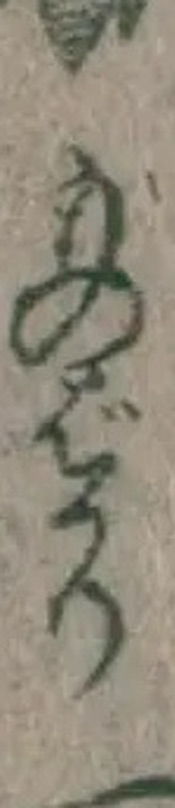ものばかり
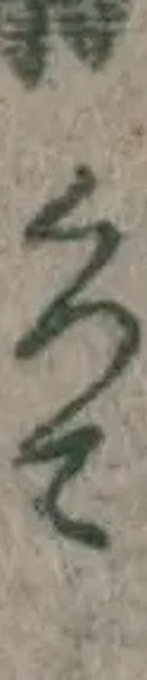くつて
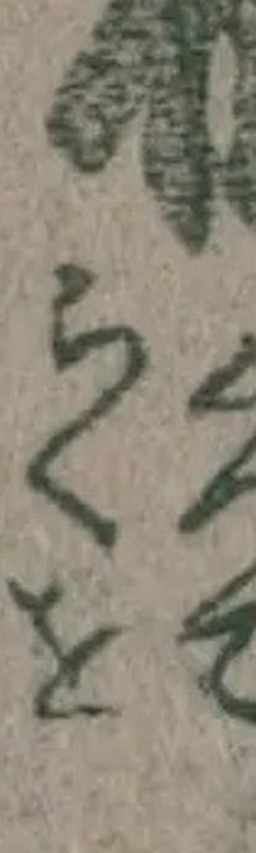らくを
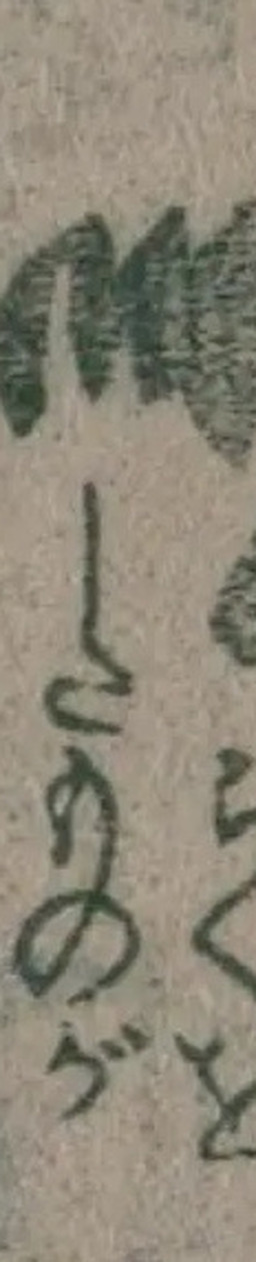したものが
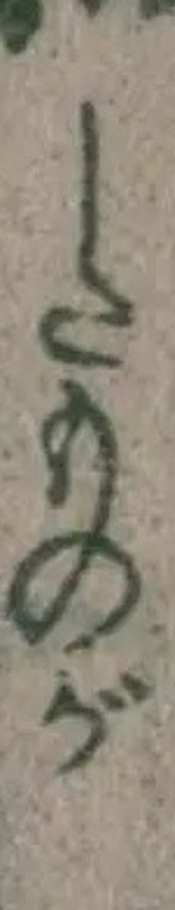したものが
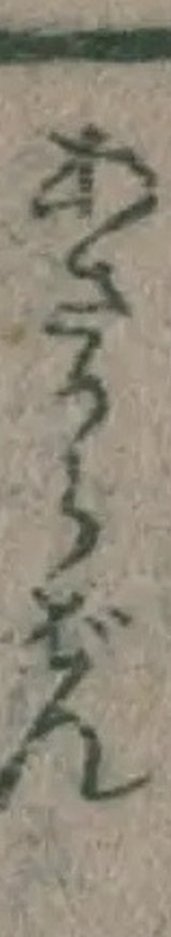あさからばん
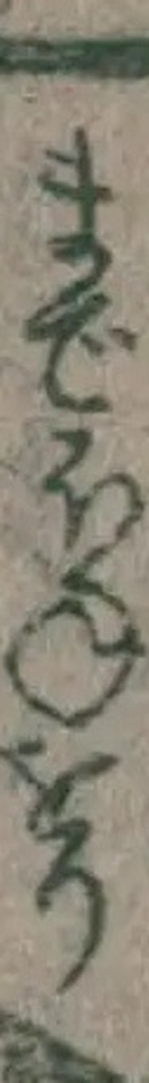までほねをり
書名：縦筒放唐の噺 3巻
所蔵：国立国会図書館 National Diet Library, JAPAN
